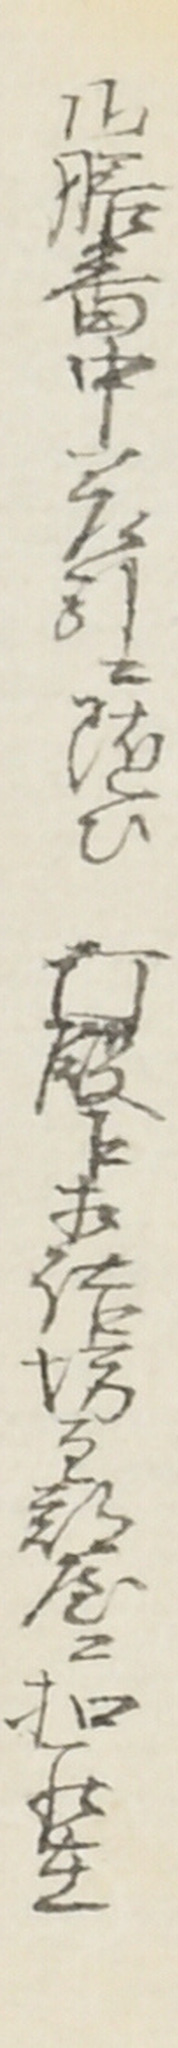御膳番中差引ニ随ひ御殿江相詰坊主部屋ニ控罷在
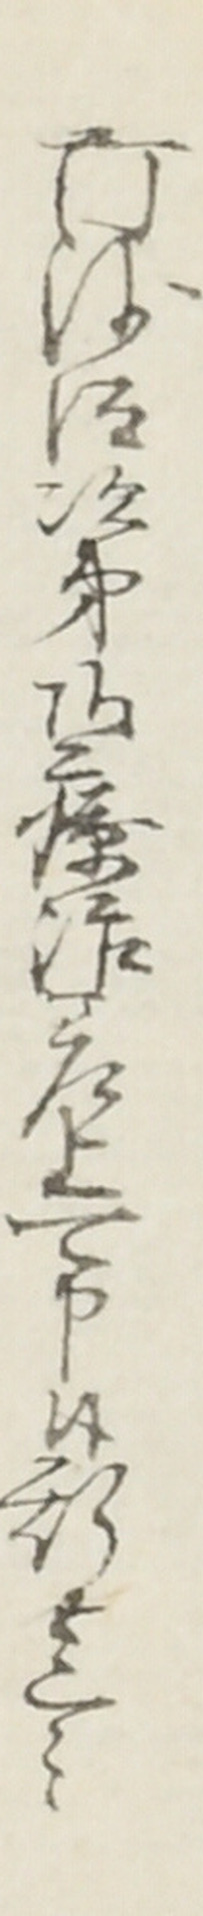御沙汰次第御療治差上可申候斯迄之
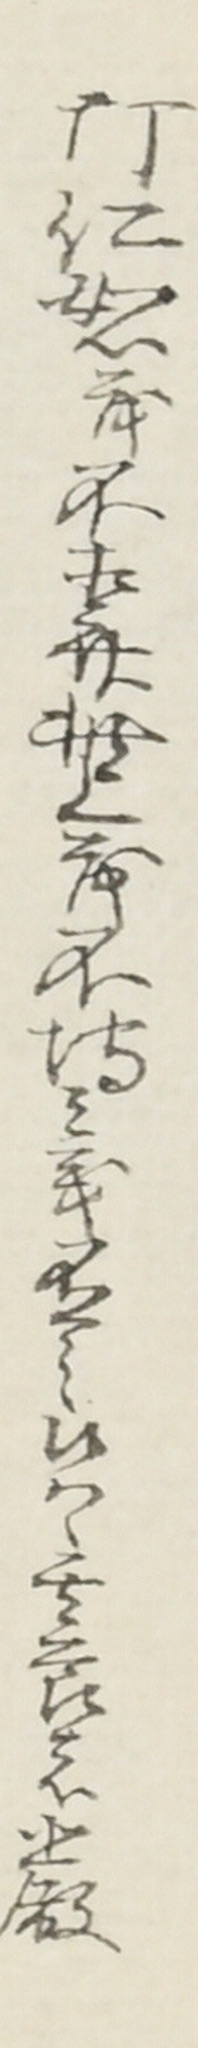御仁恕茂不相弁此上茂不埒之義有之候はゝ其節者厳
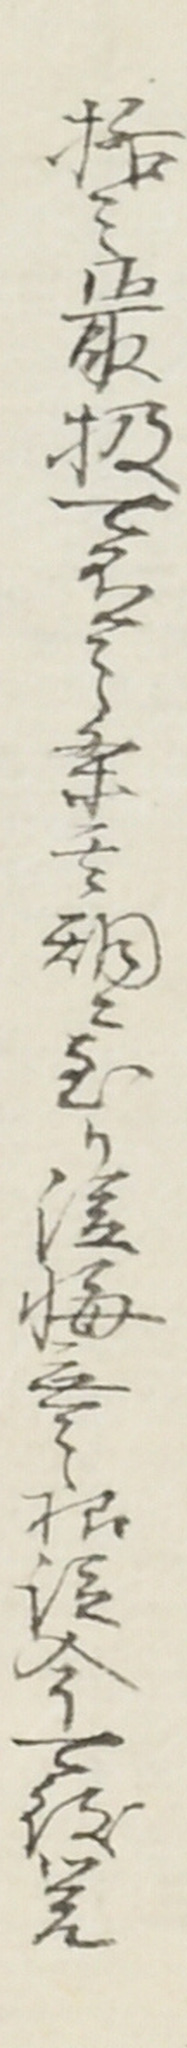格之御取扱可有之条其期ニ至リ後悔無之様従今可致覚
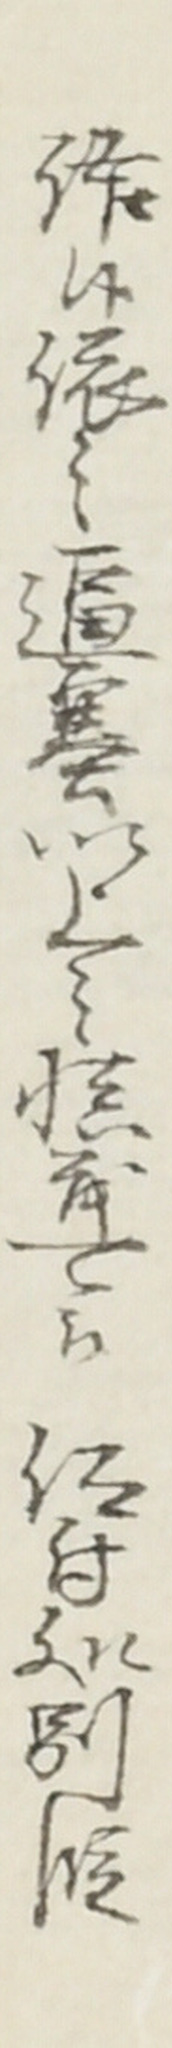悟候依之逼塞以上之慎茂可被仰付処別段
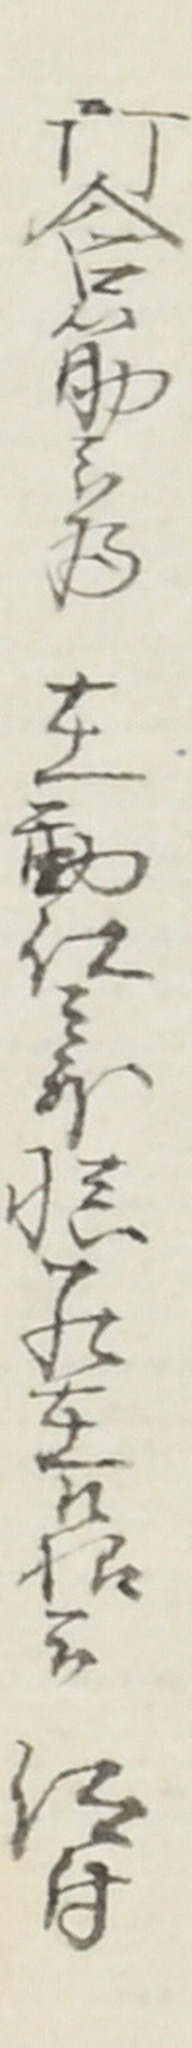御含筋被為在勤仕之外慎罷在候様被仰付

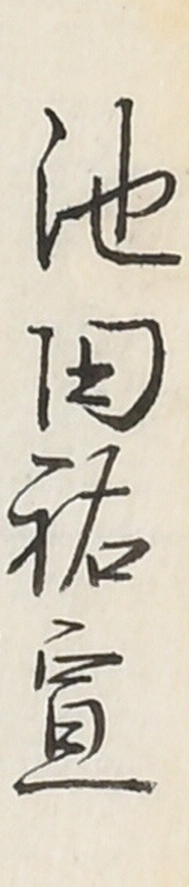池田祐宣
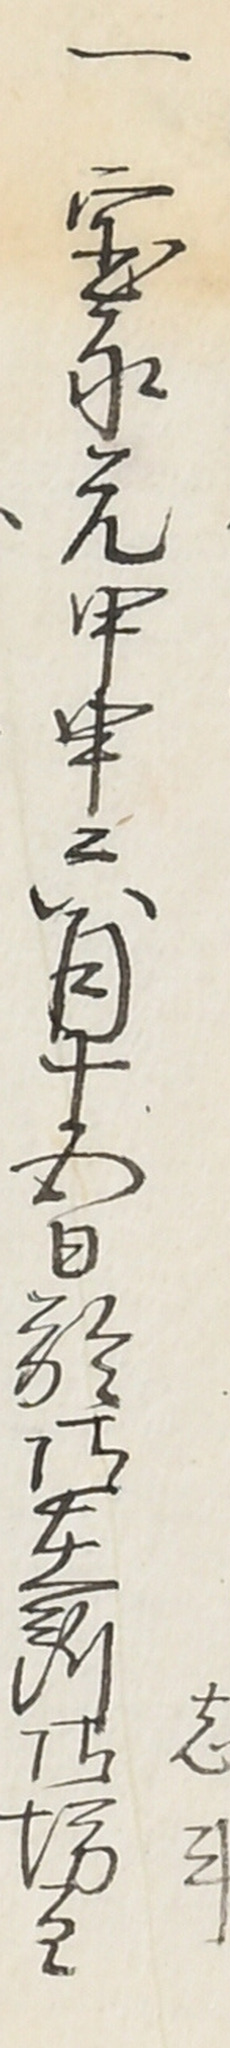一宝永元甲申六月十五日於御在所御坊主
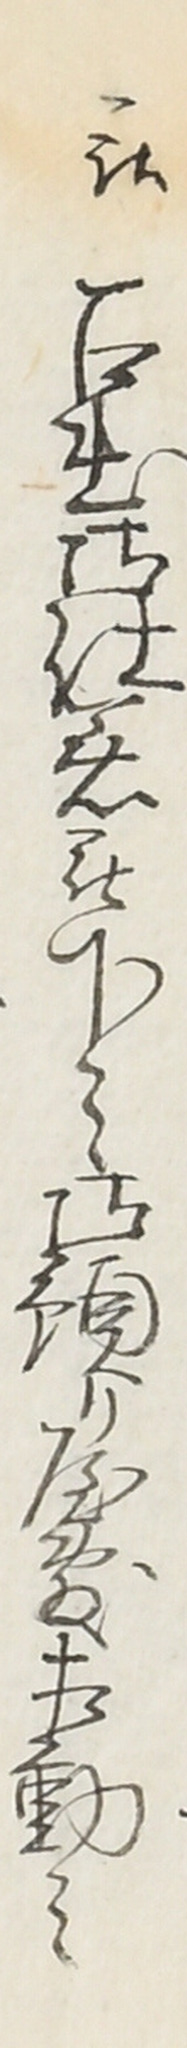被召出御仕着被下之御預リ屋敷相勤之
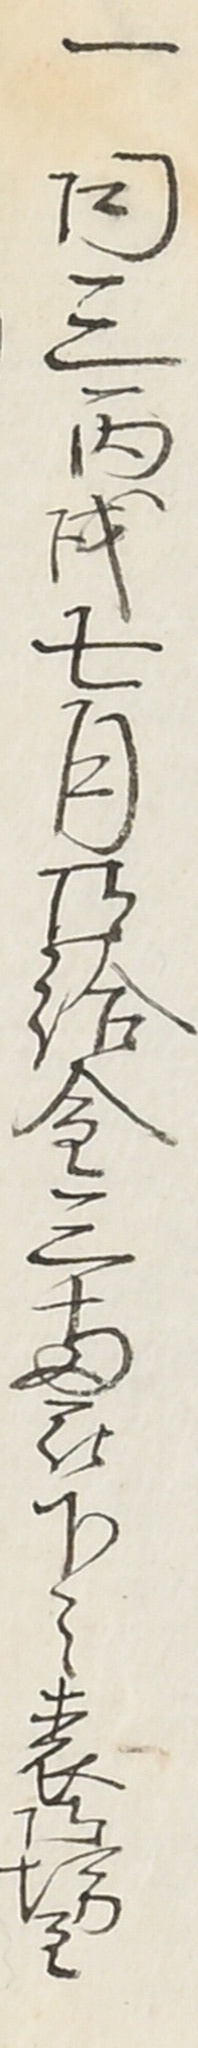一同三丙戌七月御給金三両被下之表御坊主
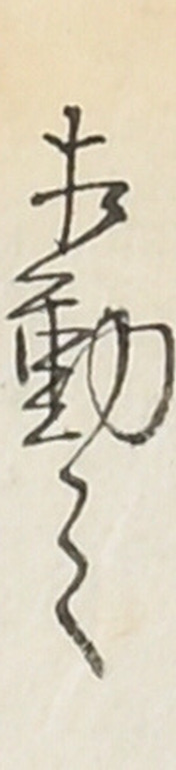相勤之
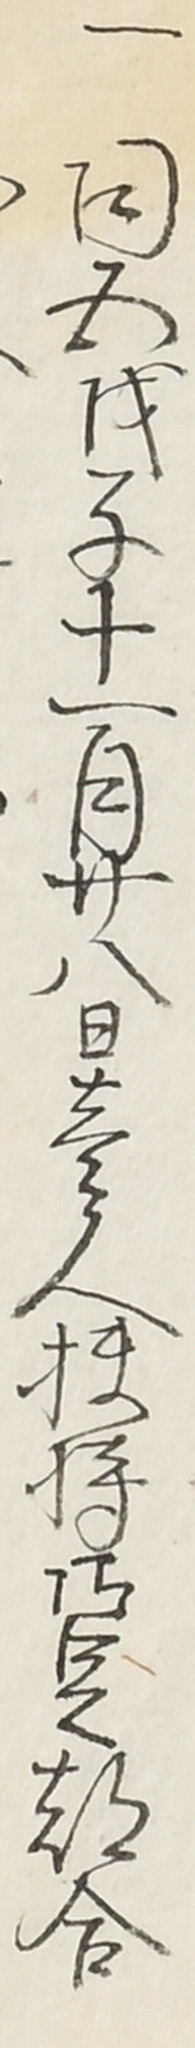一同五戊子十一月廿八日壱人扶持御足都合
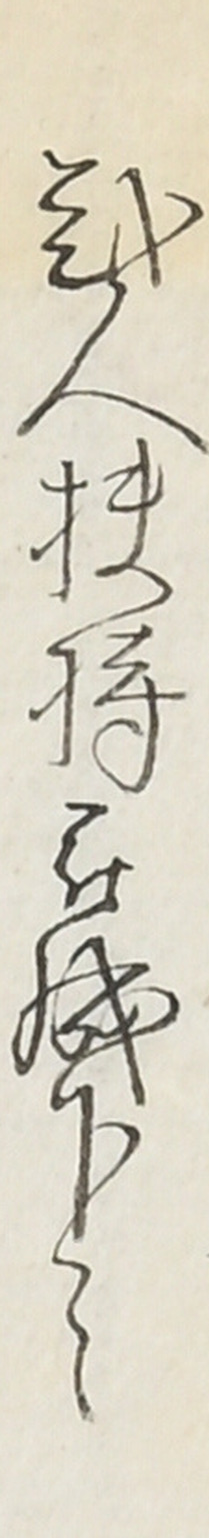弐人扶持被成下之
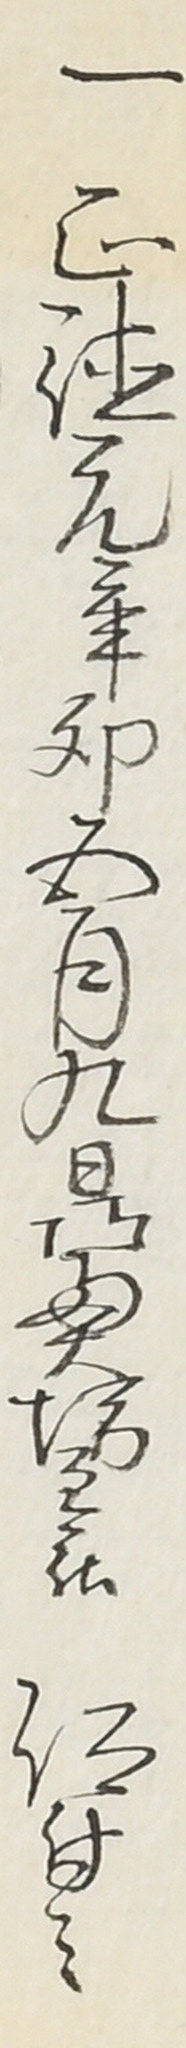一正徳元辛卯五月九日御奥坊主被仰付之
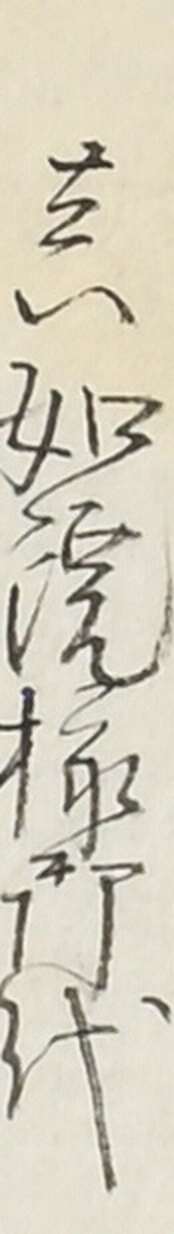真如院様御代
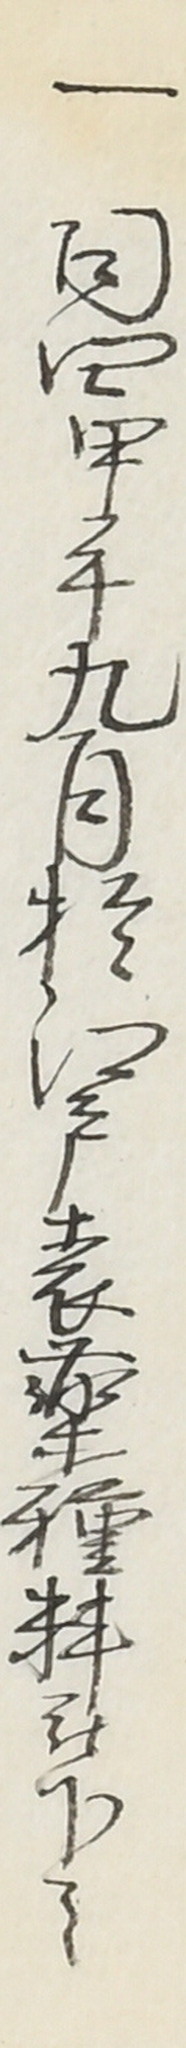一同四甲午九月於江戸表薬種料被下之
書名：給人諸士勤仕録（七）
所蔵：伊那市立高遠町図書館・合同会社AMANE
